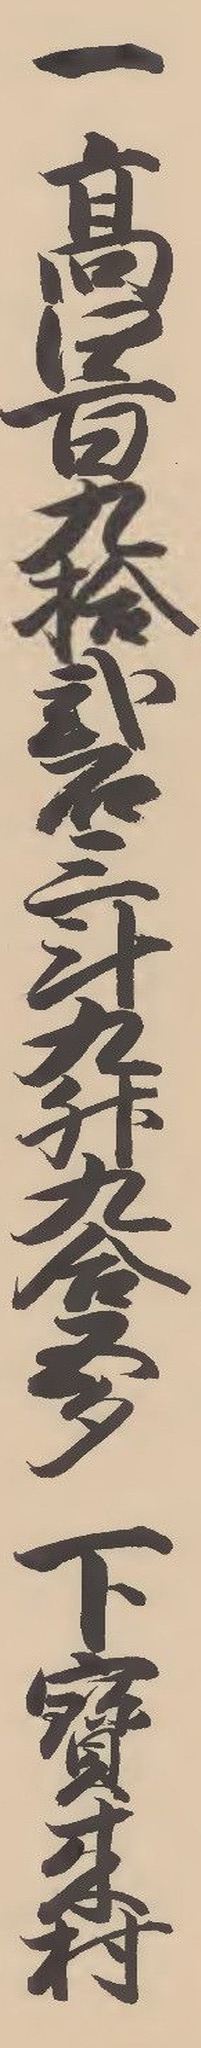一高四百九拾弐石三斗九升九合五勺下宝来村
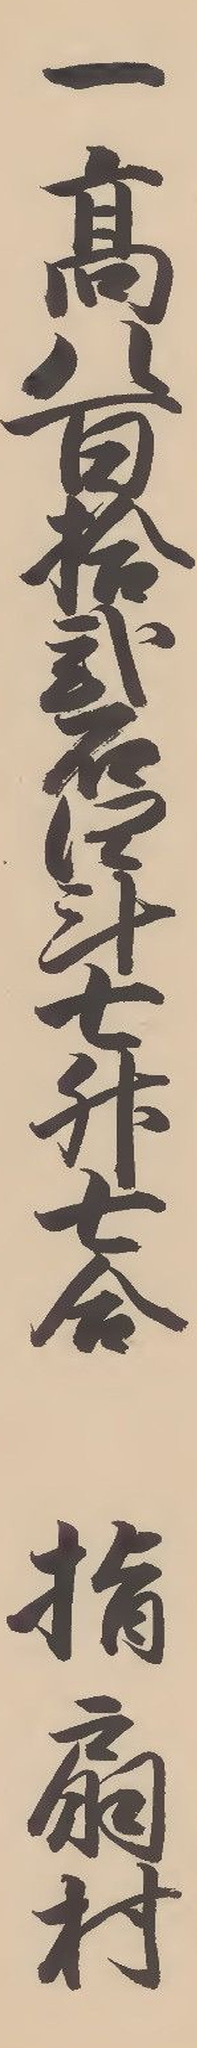一高八百拾弐石四斗七升七合指扇村
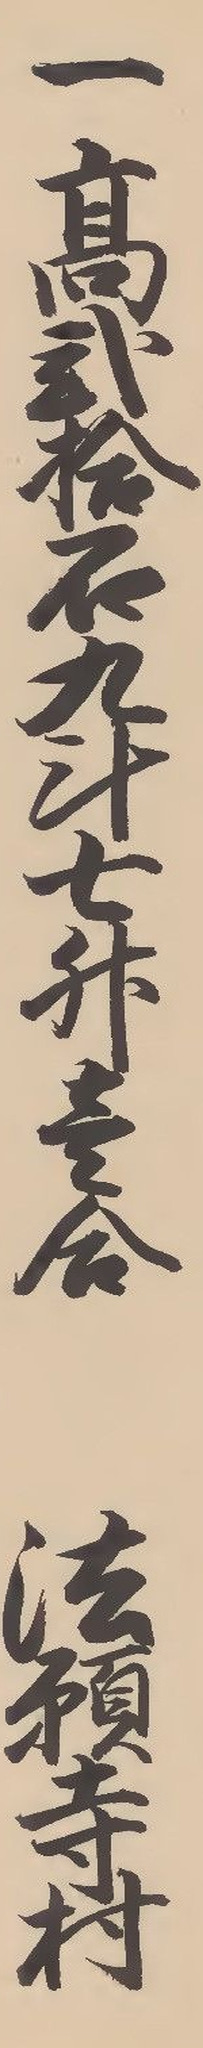一高弐拾石九斗七升壱合法願寺村
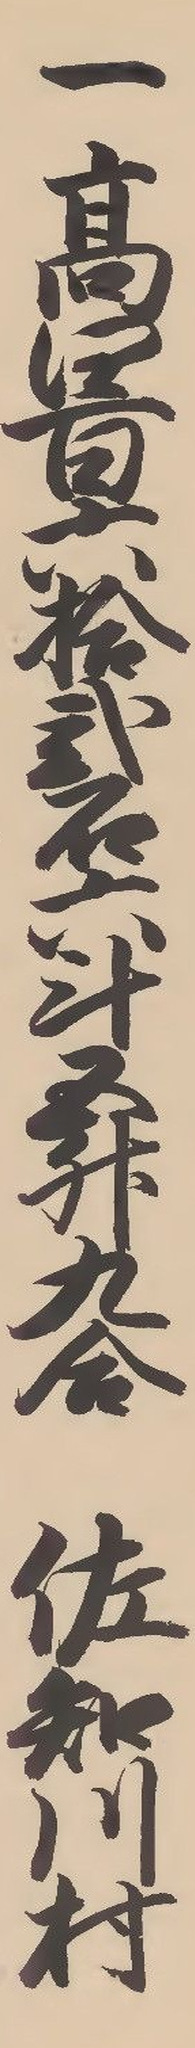一高四百六拾弐石六斗五升九合佐知川村
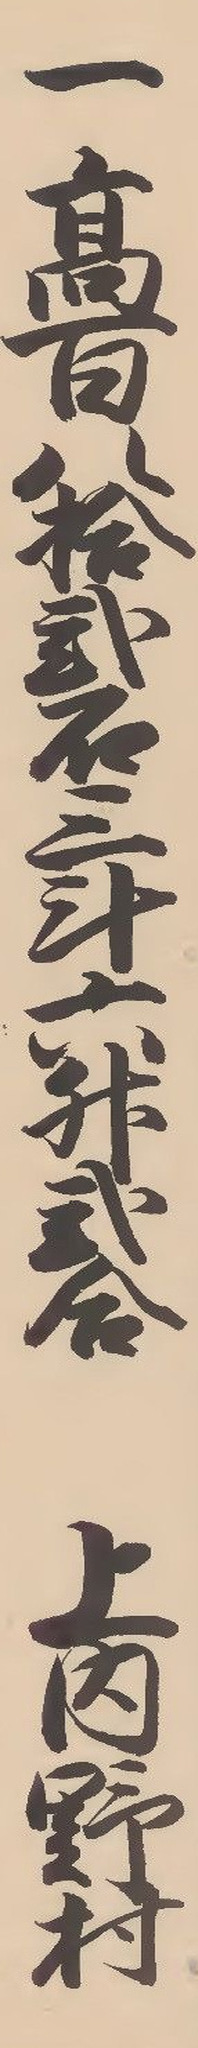一高百八拾弐石三斗六升弐合上内野村
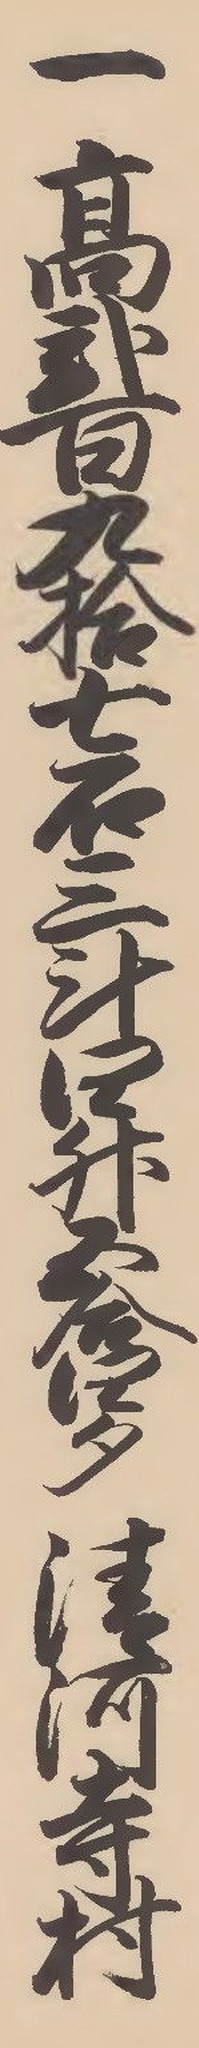一高弐百九拾七石三斗四升五合四勺清河寺村
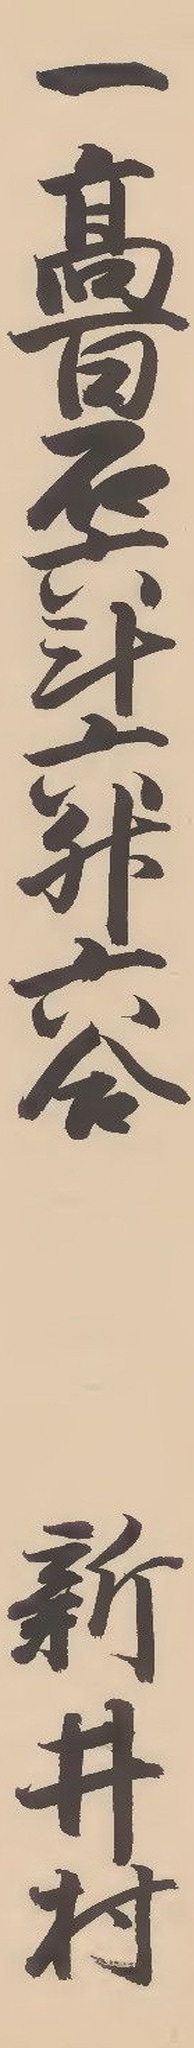一高百石六斗六升六合新井村
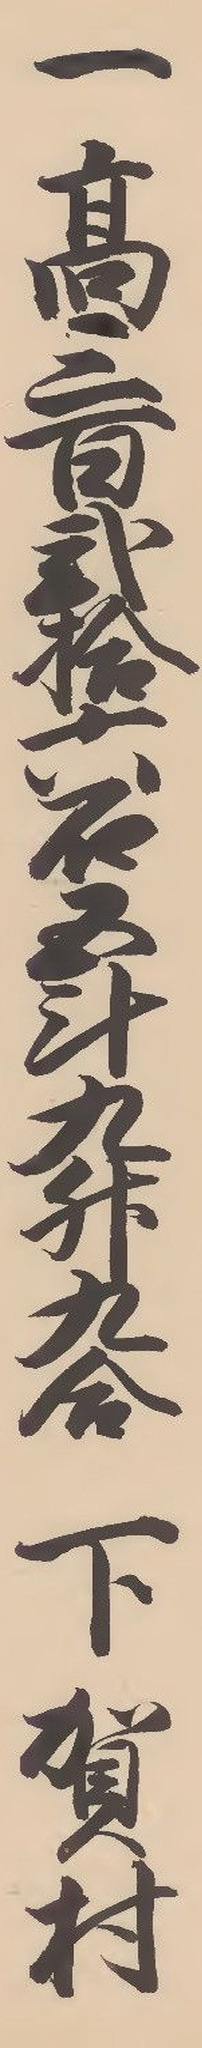一高三百弐拾六石五斗九升九合下賀村

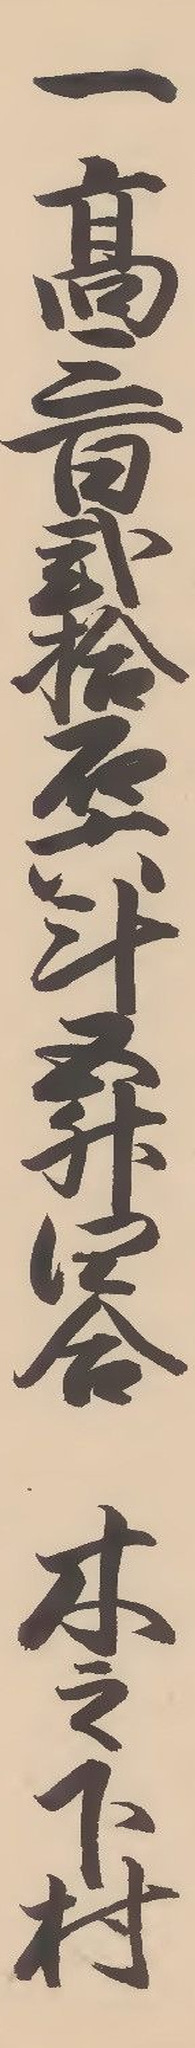一高三百弐拾石六斗五升四合木之下村
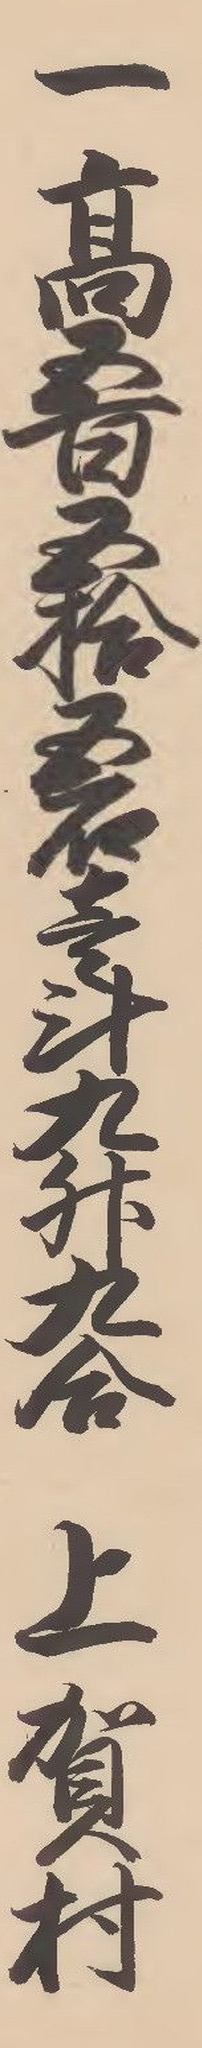一高五百五拾五石壱斗九升九合上賀村
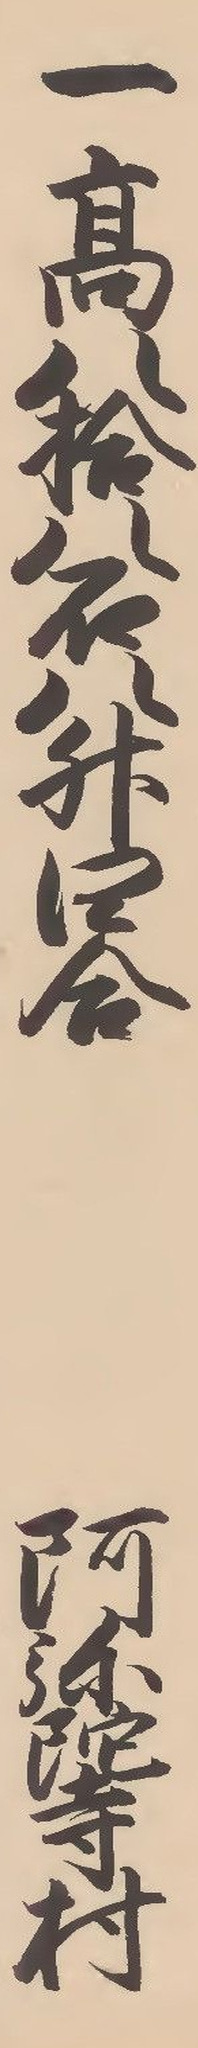一高八拾八石八升四合阿弥陀寺村
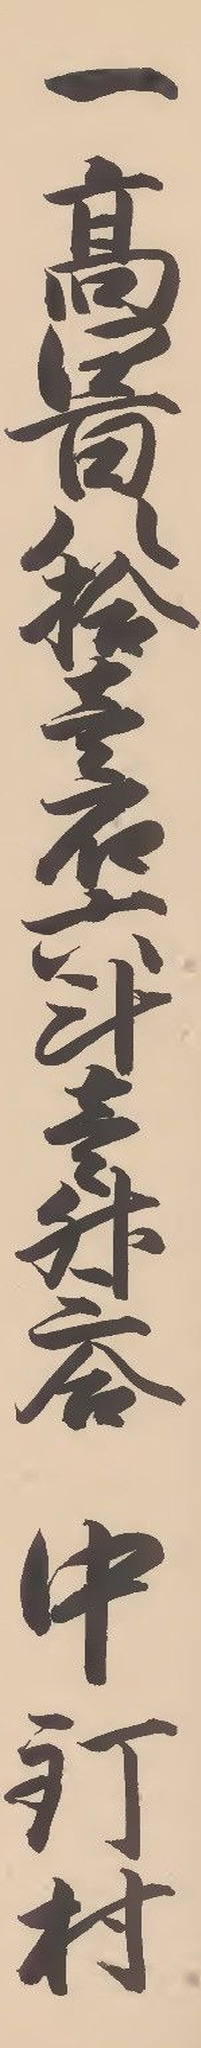一高四百八拾壱石六斗壱升三合中釘村
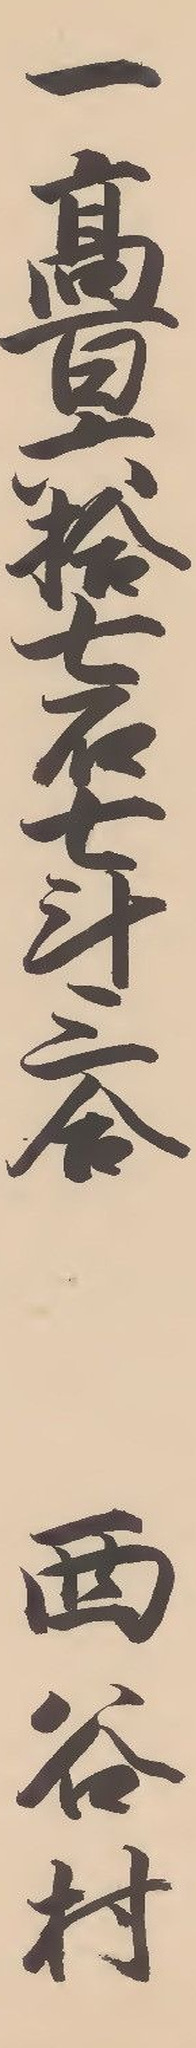一高百六拾七石七斗三合西谷村
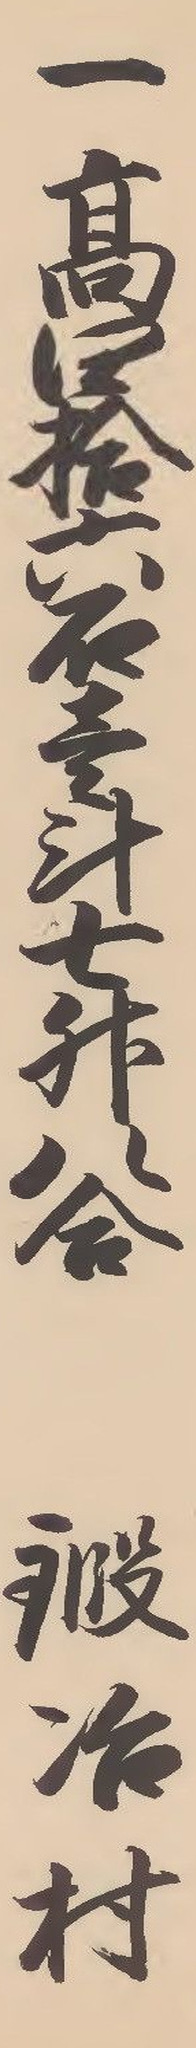一高四拾六石壱斗七升八合鍛冶村
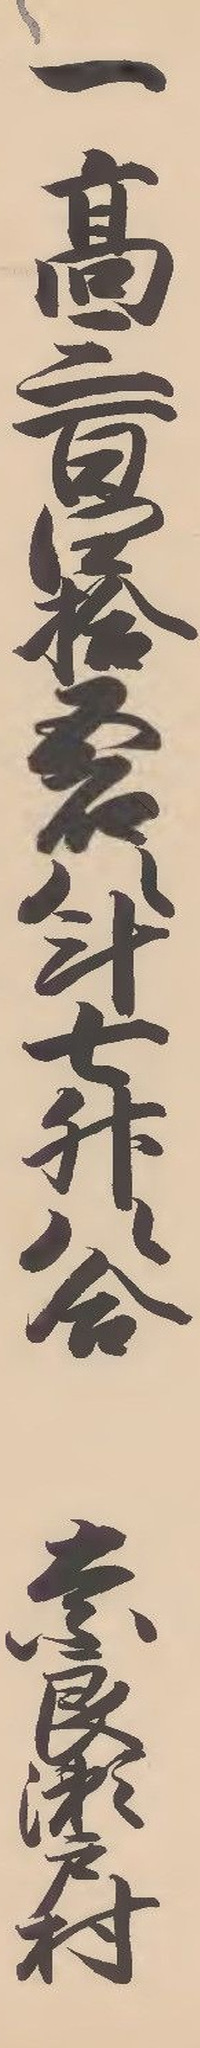一高三百四拾五石八斗七升八合奈良瀬戸村

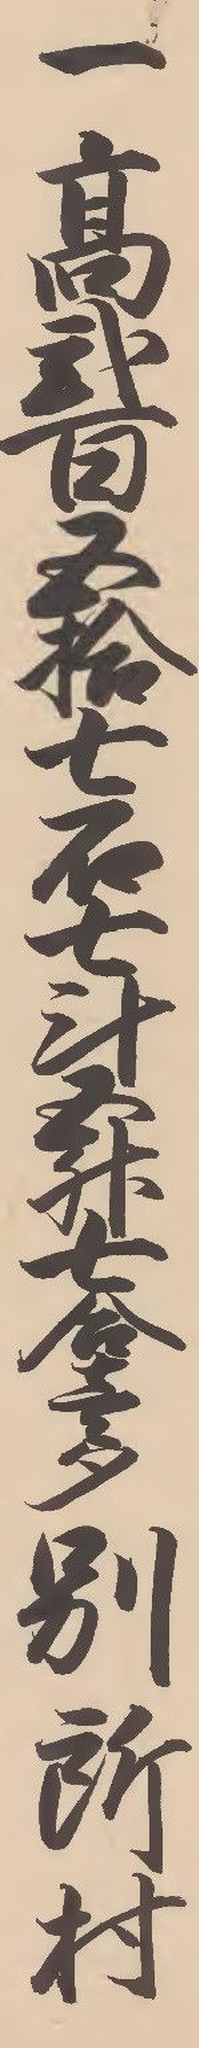一高弐百五拾七石七斗五升七合壱勺別所村
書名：武蔵国郷帳　下
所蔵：国立公文書館 National Archives of Japan
